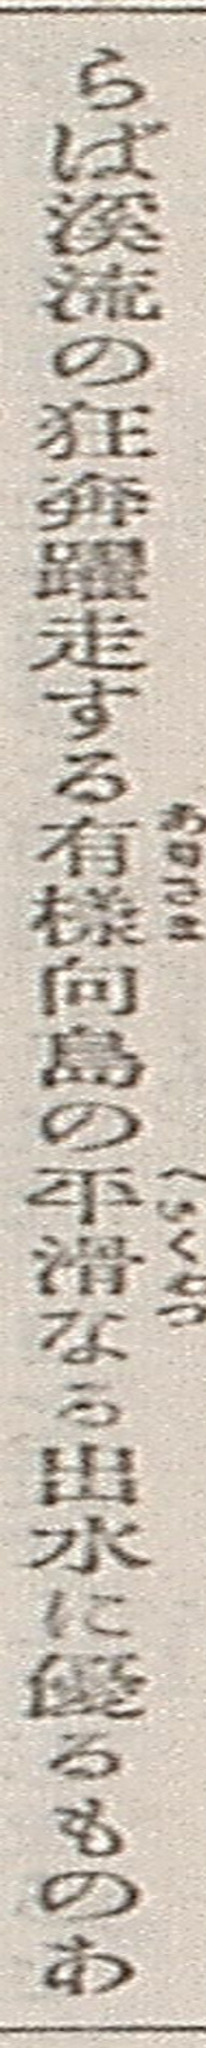らば渓流も狂奔躍走する有様向島の平滑なる出水に勝るものあ
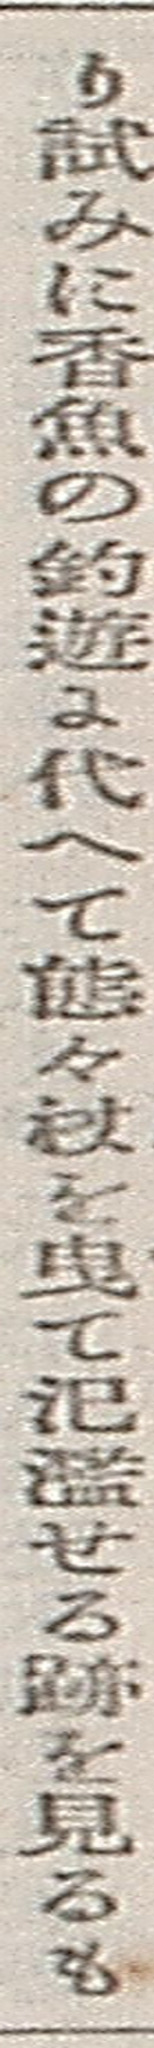り試みに香魚の釣遊に代へて態々杖を曳て氾濫せる跡を見るも
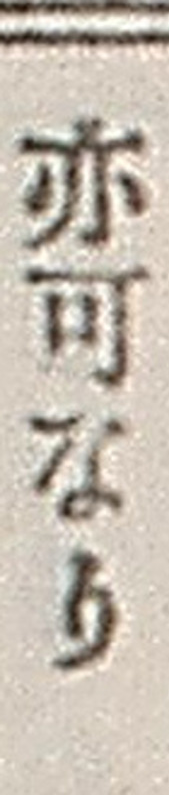亦可なり
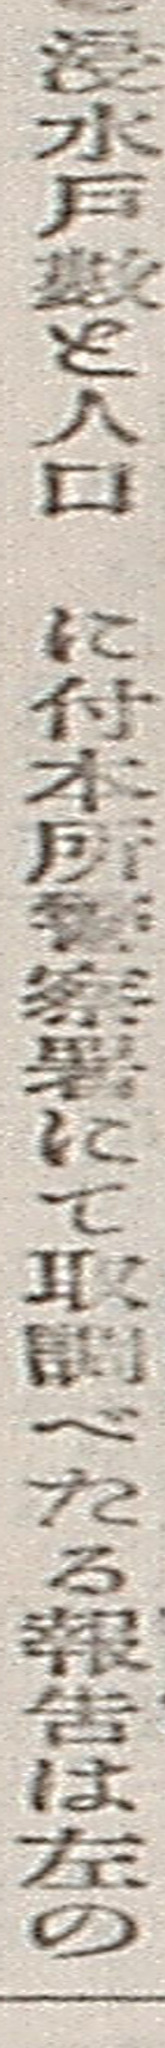●浸水戸数と人口に付本所警察署にて取調べたる報告は左の
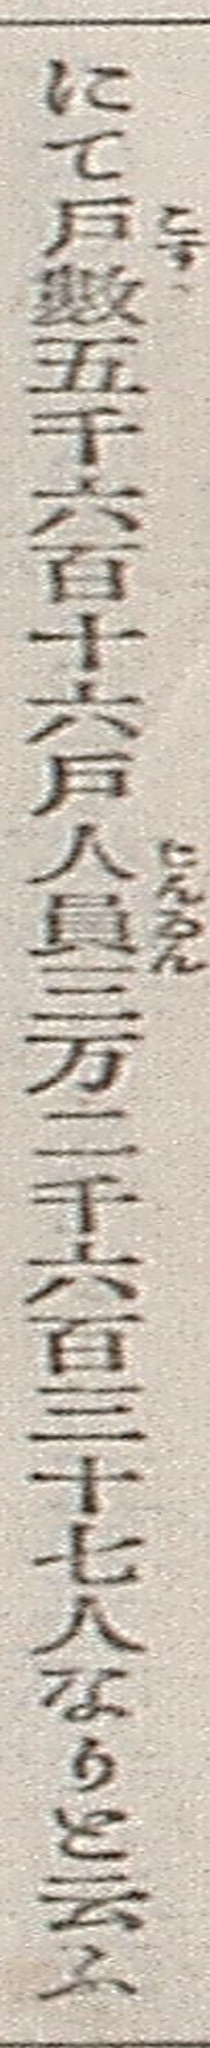にて戸数五千六百十六戸人員三万二千六百三十七人なりと云ふ
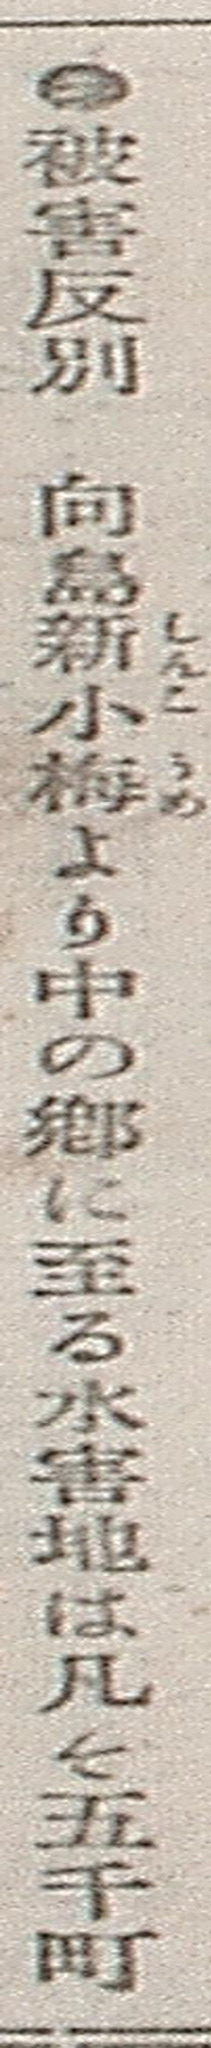●被害反別向島新小梅より中の郷に至る水害地は凡そ五千町
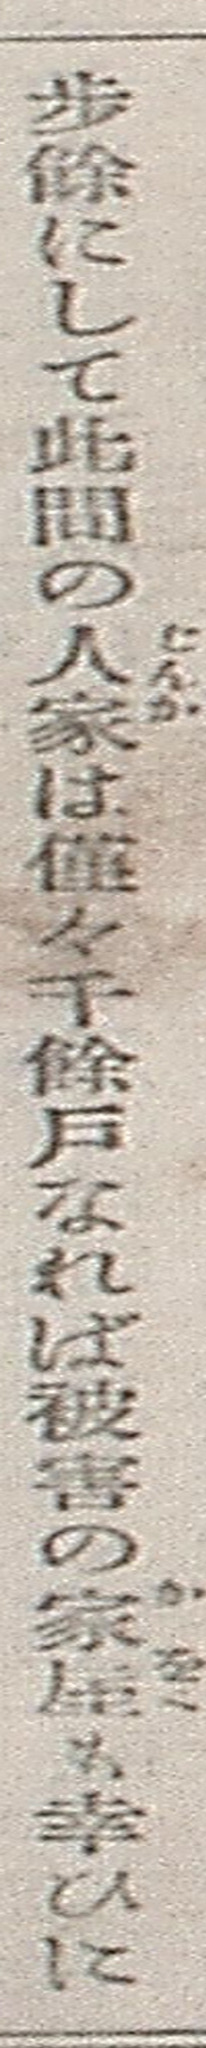歩余にして此間の人家は僅々千余戸なれば被害の家屋も幸ひに

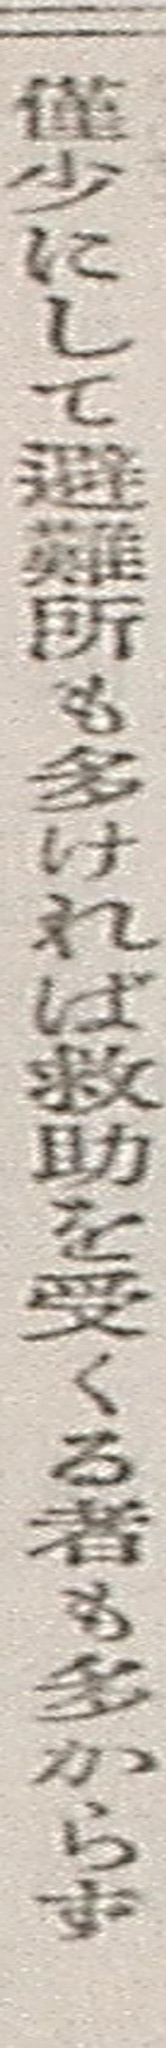僅少にして避難所も多ければ救助を受くる者も多からず
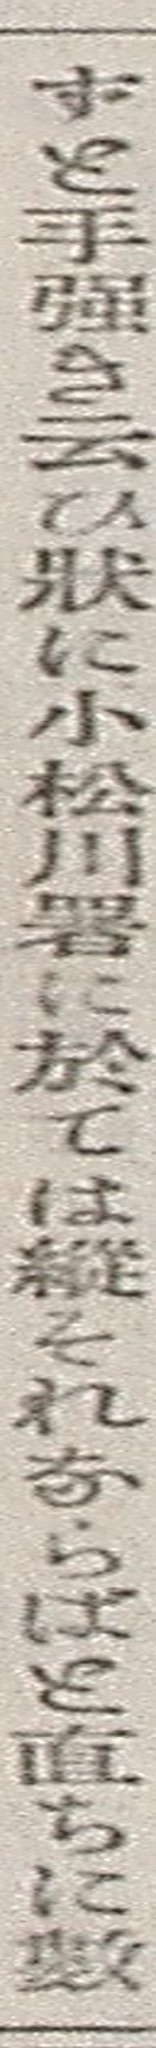ずと手強き云ひ状に小松川署に於ては縦それならばと直ちに数
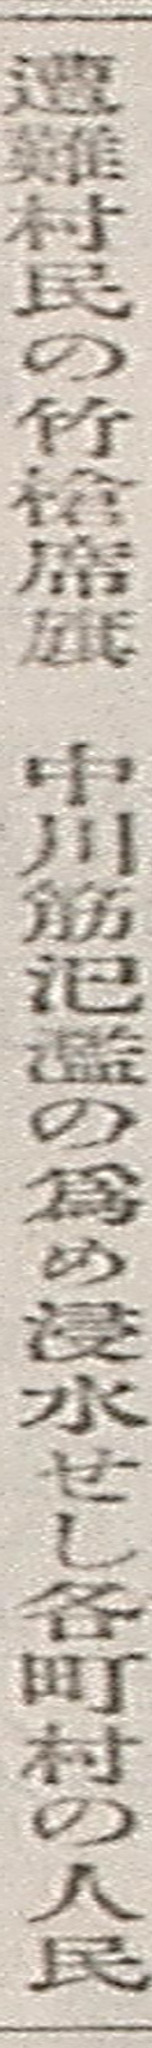遭難村民の竹槍席旗中川筋氾濫の為め浸水せし各町村の人民
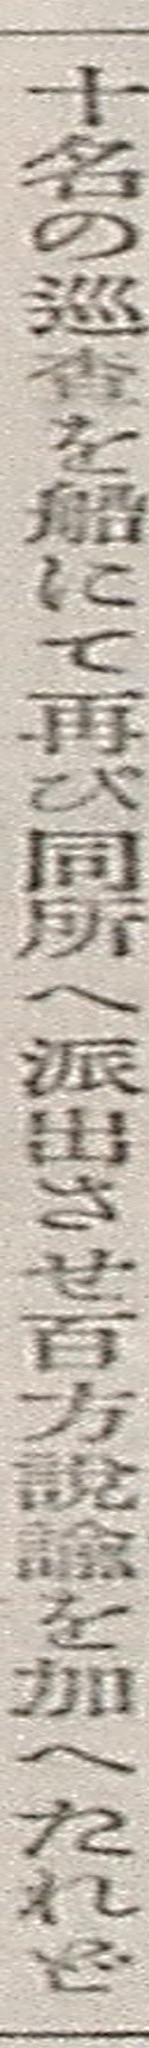十名の巡査を船にて再び同所へ派出させ百方説諭を加へたれど
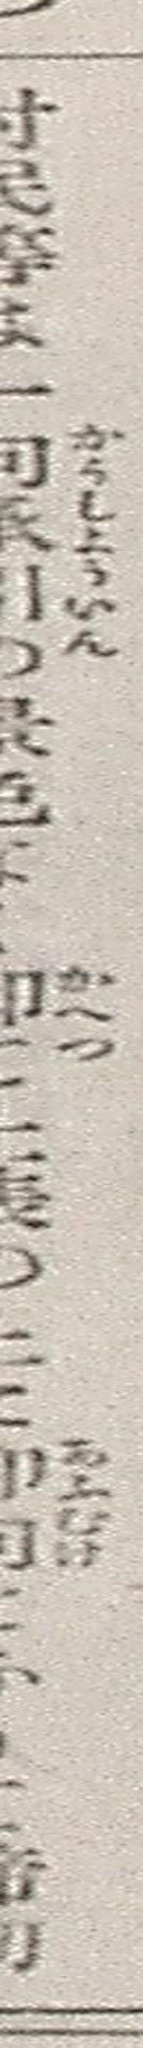村民等は一向承引の景色なく却て土俵の上に仰向となりて締切
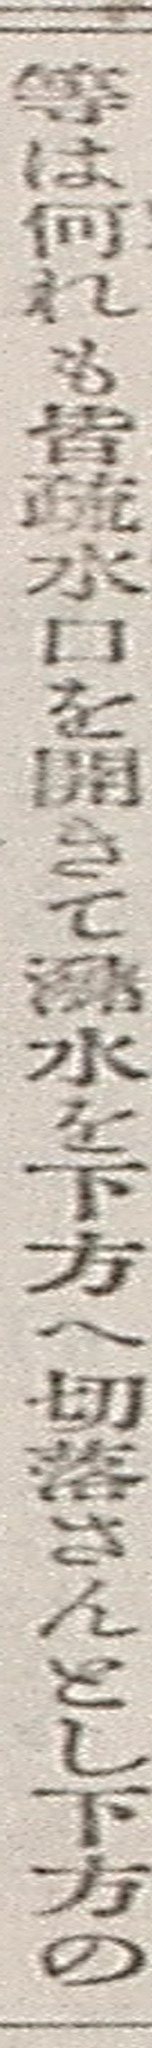等は何れも皆疏水口を開きて瀦水を下方へ切落さんとし下方の
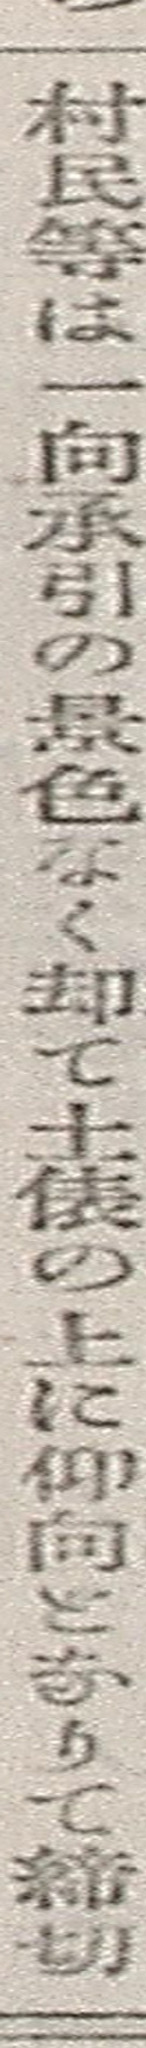村民等は一向承引の景色なく却て土俵の上に仰向となりて締切
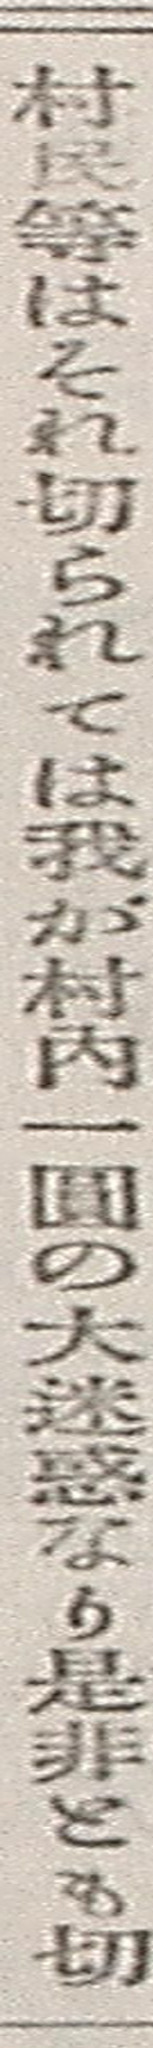村民等はそれ切られては我が村内一円の大迷惑なり是非とも切
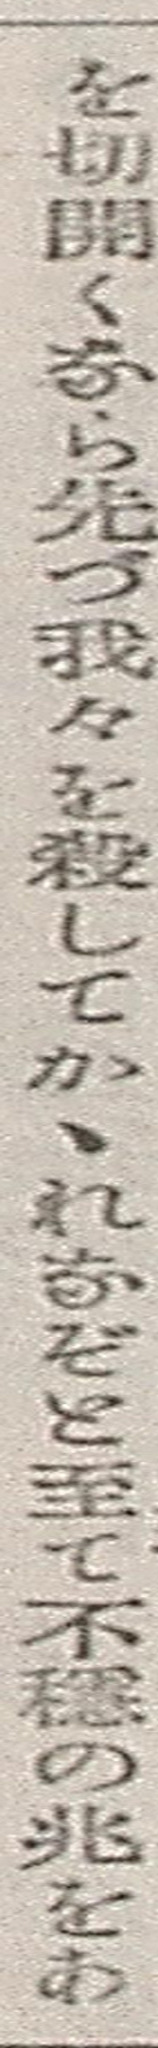を切開くなら先づ我々を殺してかゝてなぞと至て不穏の兆をあ
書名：風俗畫報臨時増刊第百二十四號　洪水地震被害録（上）
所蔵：東京大学地震研究所図書室 Earthquake Research Institute Library, The University of Tokyo, JAPAN
